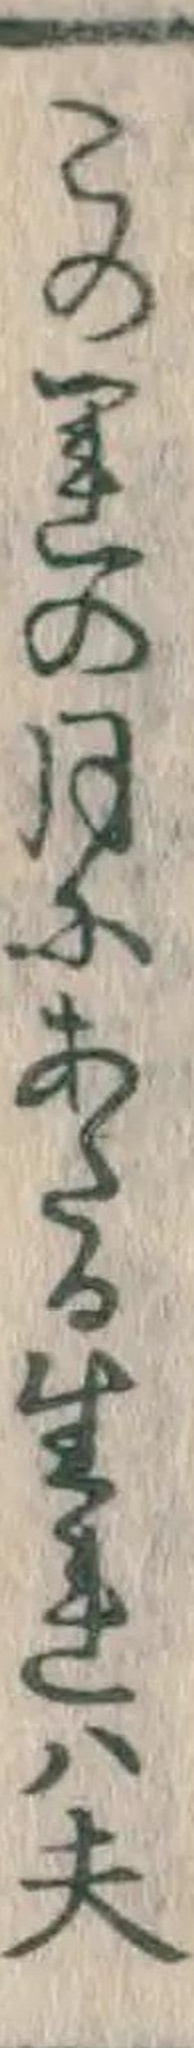この運の月にあたる生れは夫
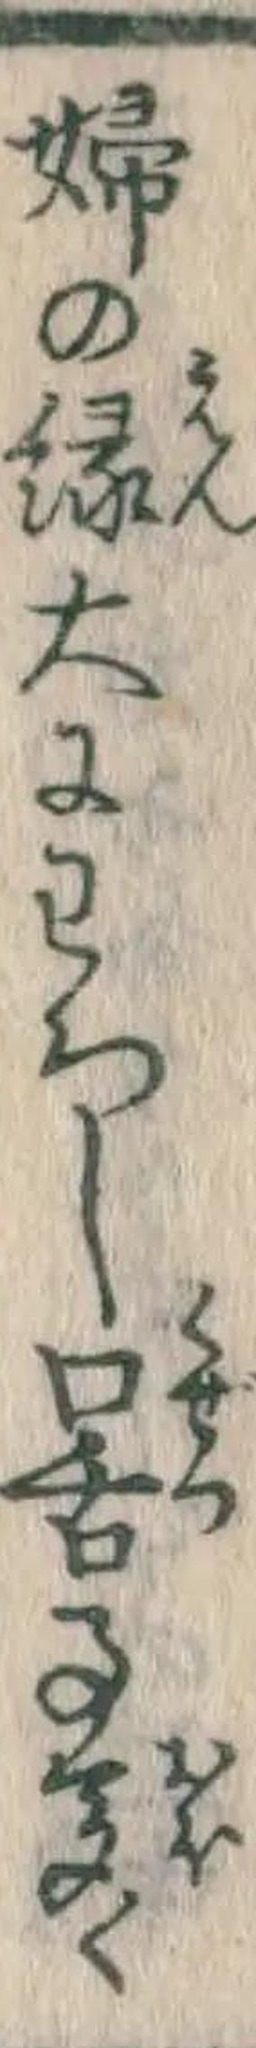婦の縁大にわろし口舌事多く
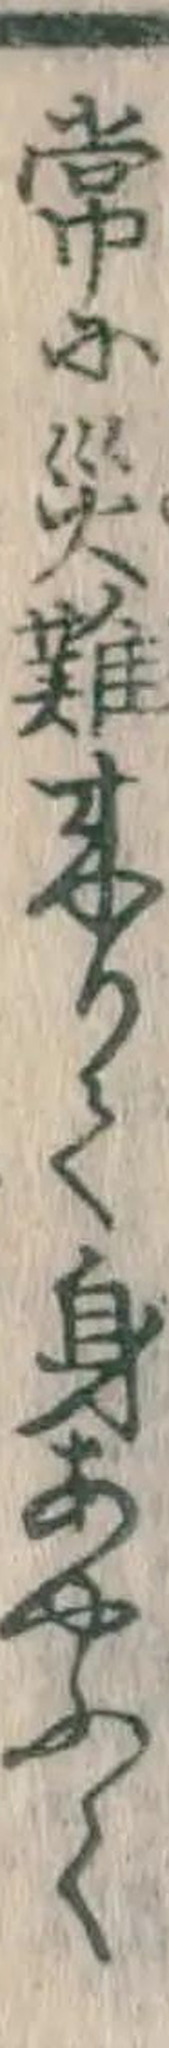常に災難来りて身あやふく
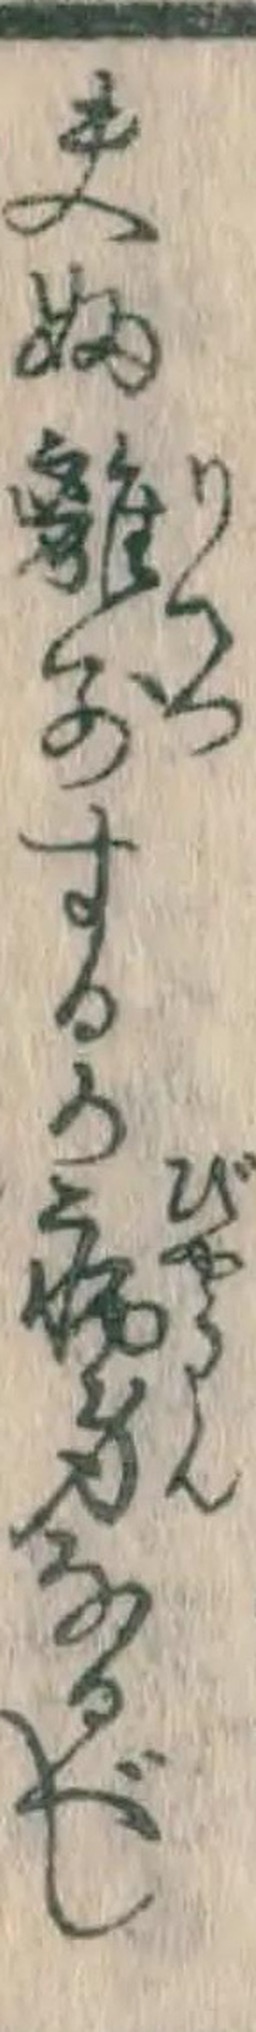夫婦離別するか病身なるべし
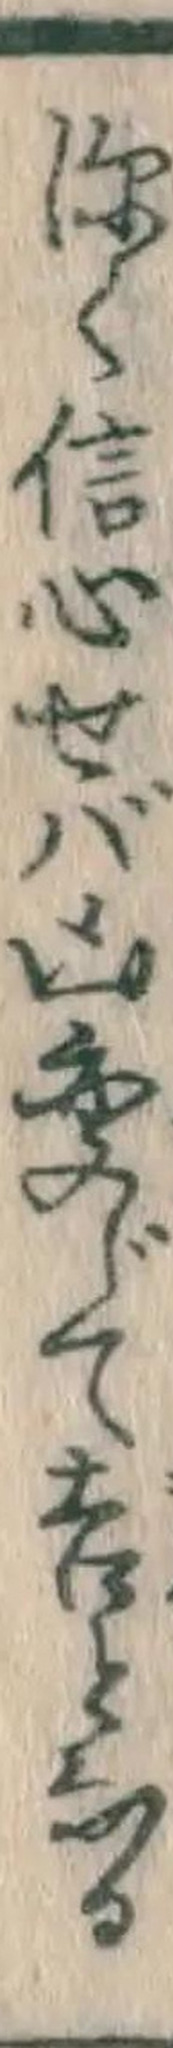深く信心せば凶変じて吉となる

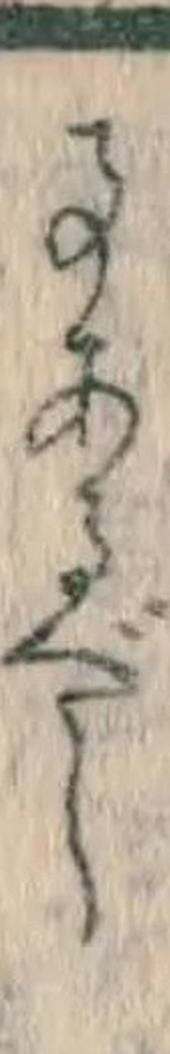事あるべし
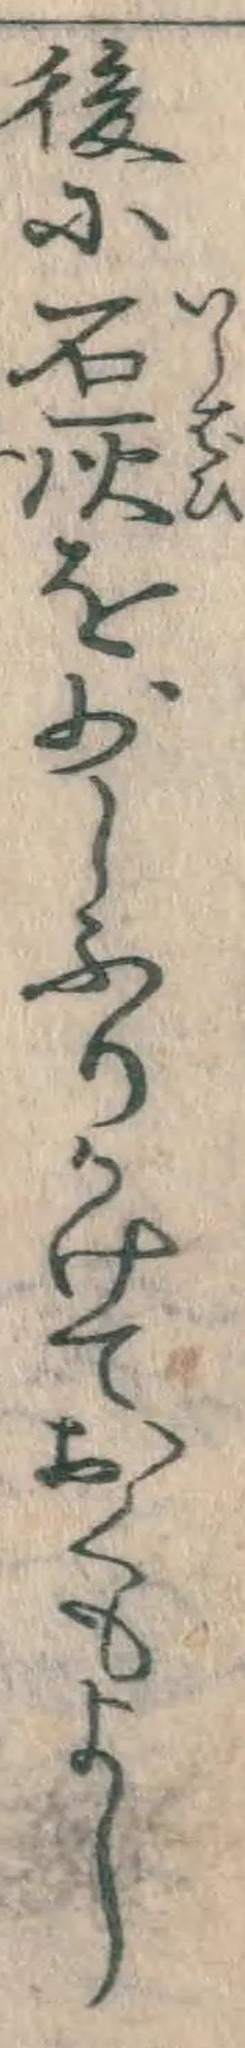後に石灰を少しふりかけておくもよし
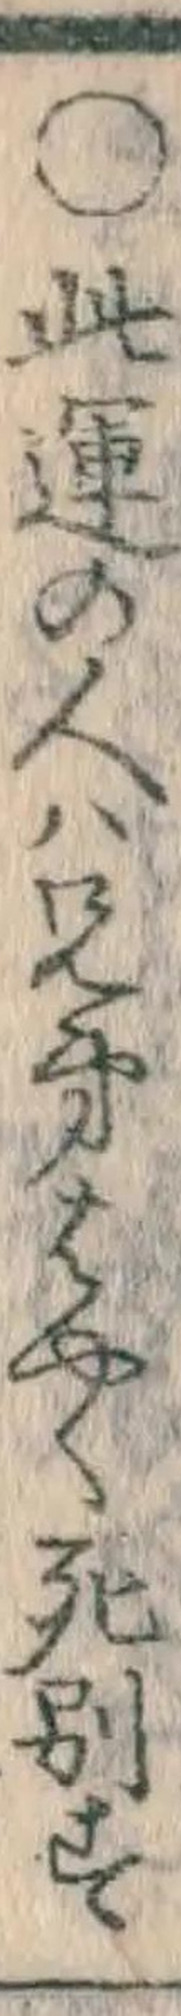○此運の人は兄弟はやく死別す
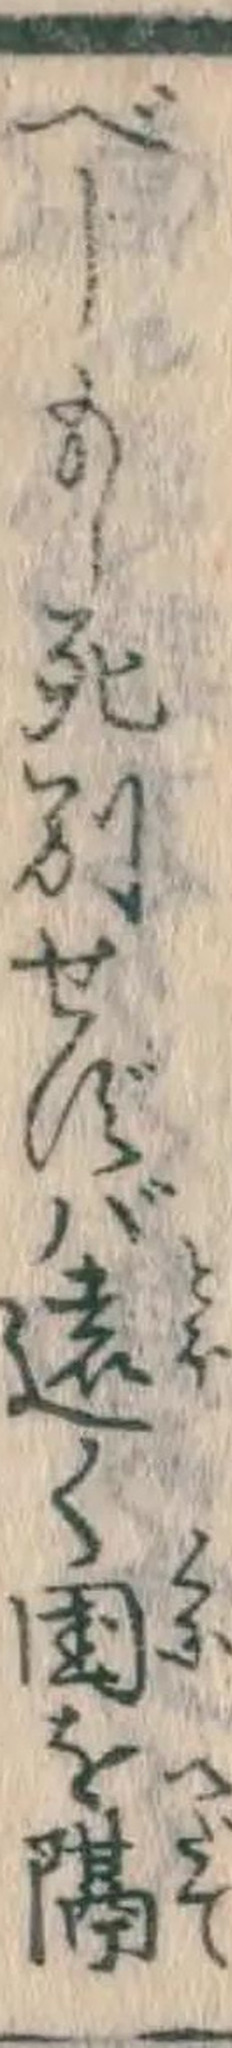べしもし死別せずば遠く国を隔
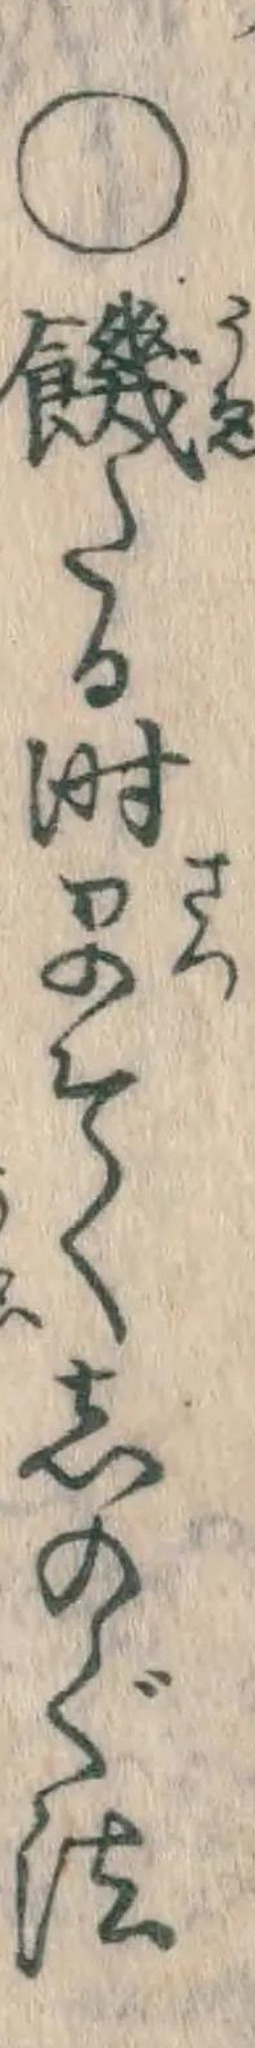○饑たる時早そくしのぐ法
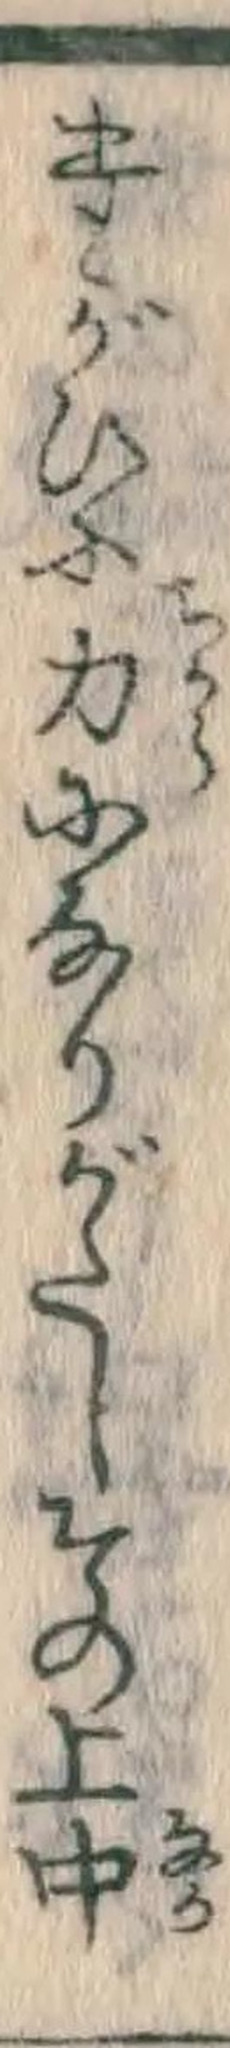たがひに力になりがたしその上中
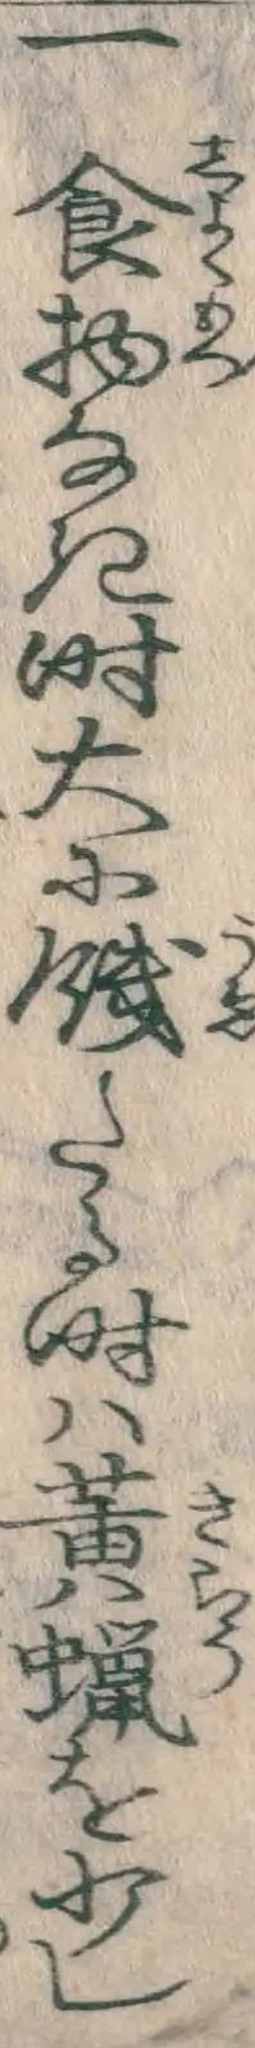一食物なき時大に饑たる時は黄蠟を少し
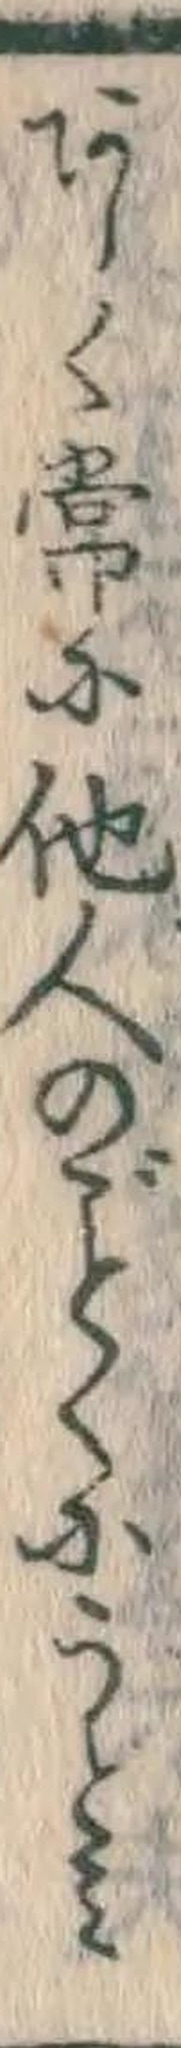あしく常に他人のごとくにうとみ
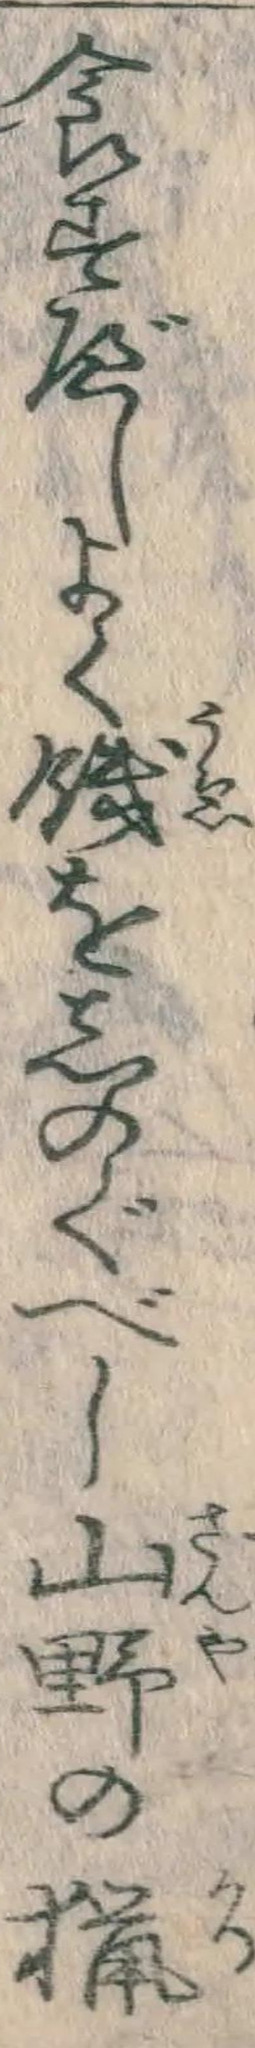食すべしよく饑をしのぐべし山野の猟
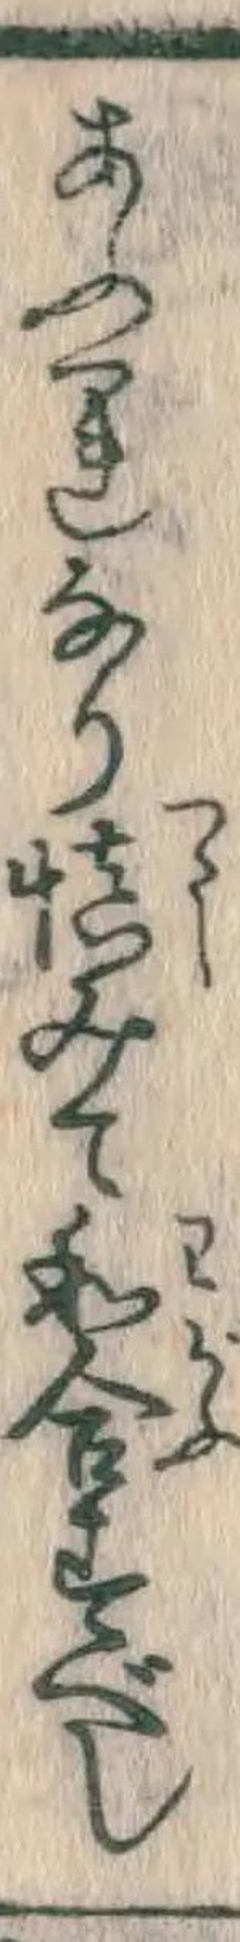あふ運なり慎みて和合すべし
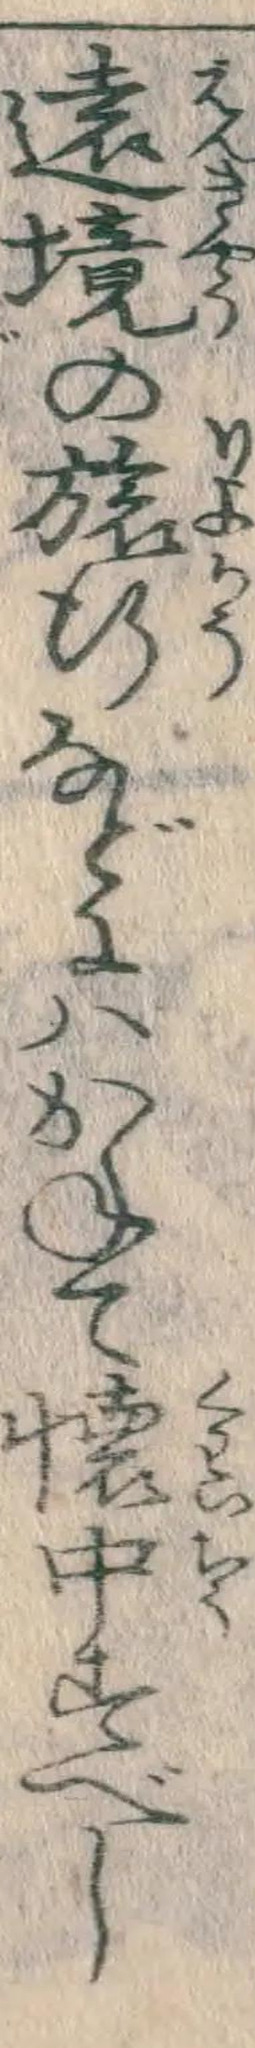遠境の旅行などにはかねて懐中すべし
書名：広益秘事大全 3巻. [2]
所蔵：国立国会図書館 National Diet Library, JAPAN
